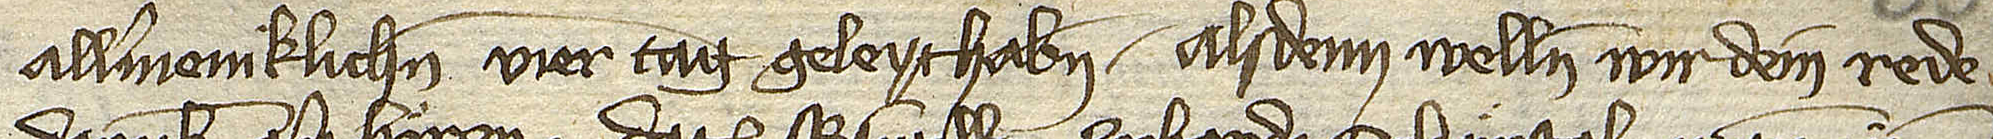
all*meniklichn* vier tag geleyt habn* / alſdenn welln* wir dein rede
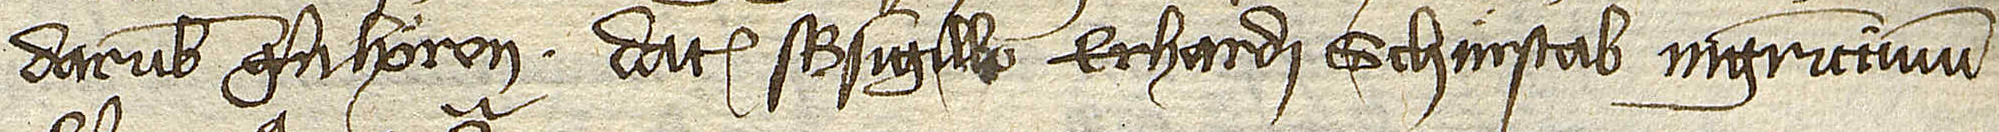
darub* g*n hören . dat* ſ* ſigillo Erhardi Schürſtab m*griciuiu*
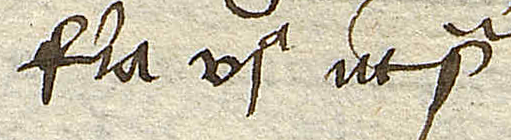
fi*a vi* ut ſ*
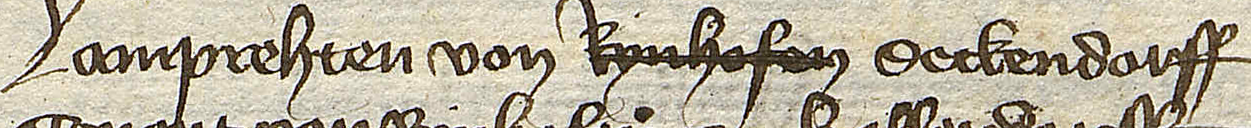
Lamprehten von Rynhofen Seckendorff
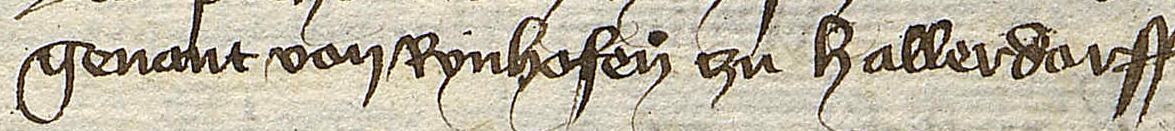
genant von Rynhofen cʒu hallerdorff
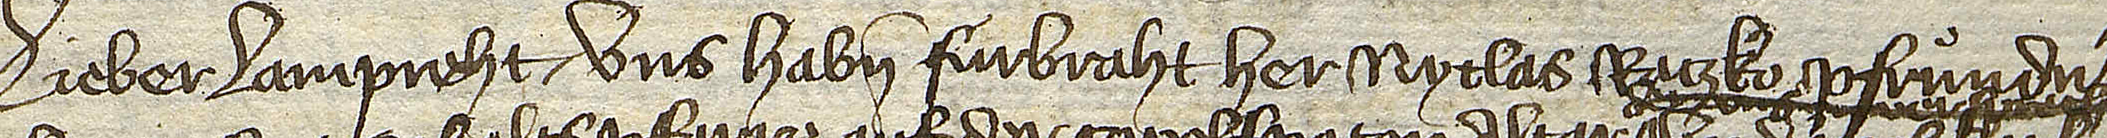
Lieber Lampreht / Vns habn* fürbraht her Nyclas Racʒko pfründn*
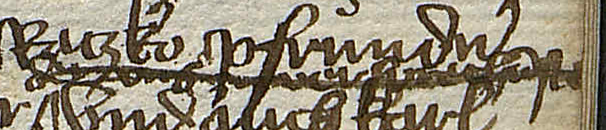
der vns ʒu verſprechn* ſtet
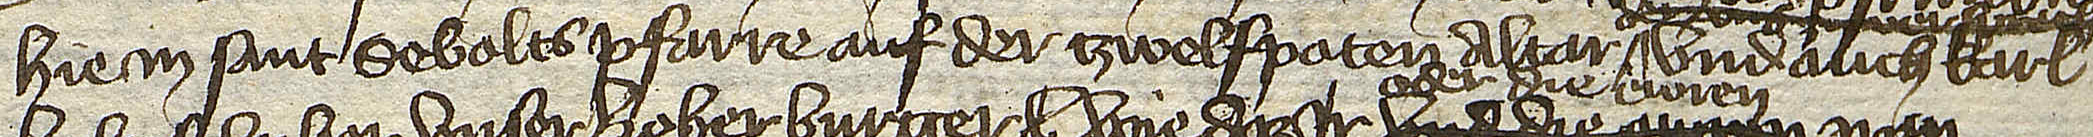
hie in ſant Sebolts pfarre auf der cʒwelfpoten Altar vnd auch karl
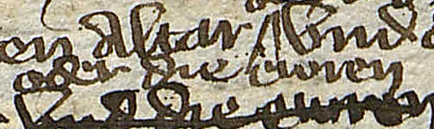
oder die ewren
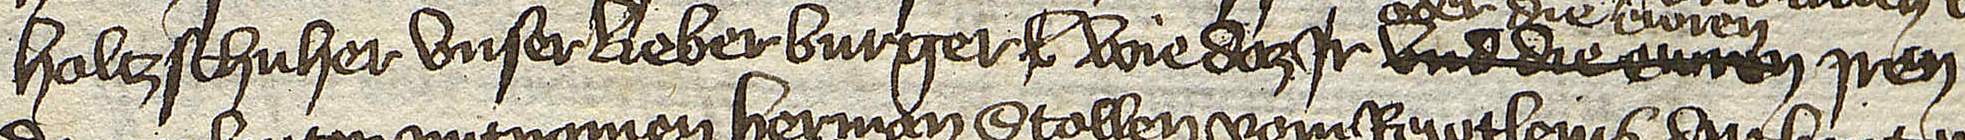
holcʒſchuher vnſer lieber burger l wie daʒ Ir vnd die ewren Iren
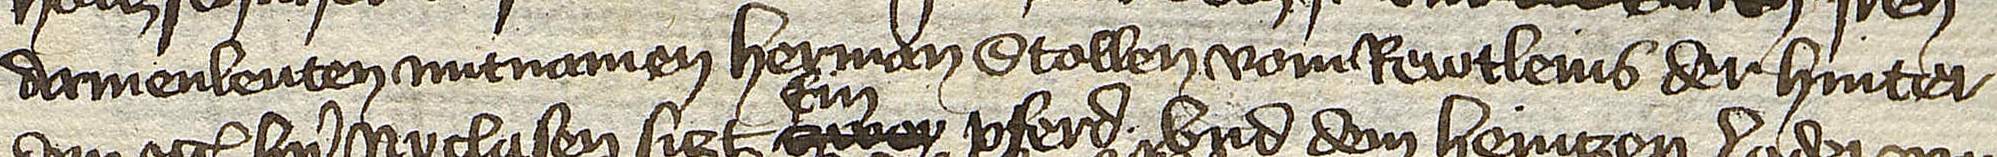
Armenleuten mitnamen herman Stollen vom Rewtleins der hinter
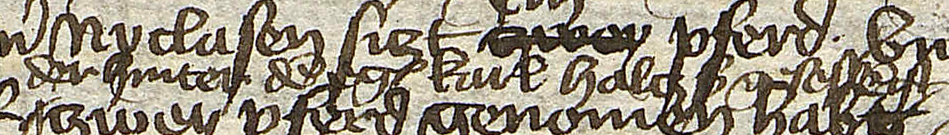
der hinter d* eg* karl holcʒſ* geſeſſe* iſt
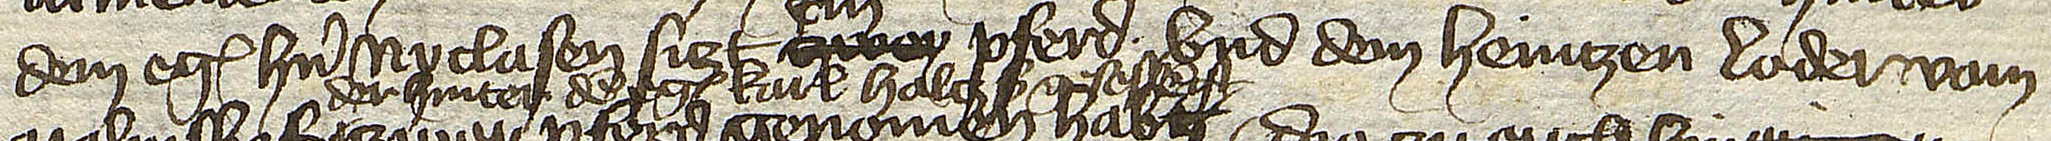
dem eg* hn* Nyclaſen ſicʒt cʒwey pferd vnd dem heincʒen loder vom
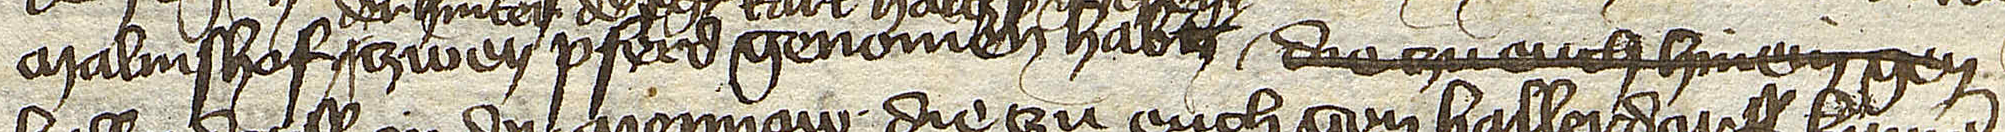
Malmſhof cʒwey pferd genomen habn* / die cʒu euch hinein gen
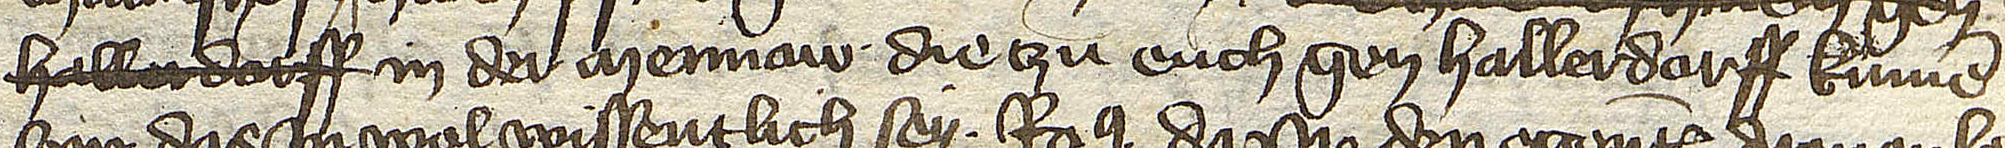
hallerdorff in der Meinaw . die cʒu euch gen hallerdorff kume*
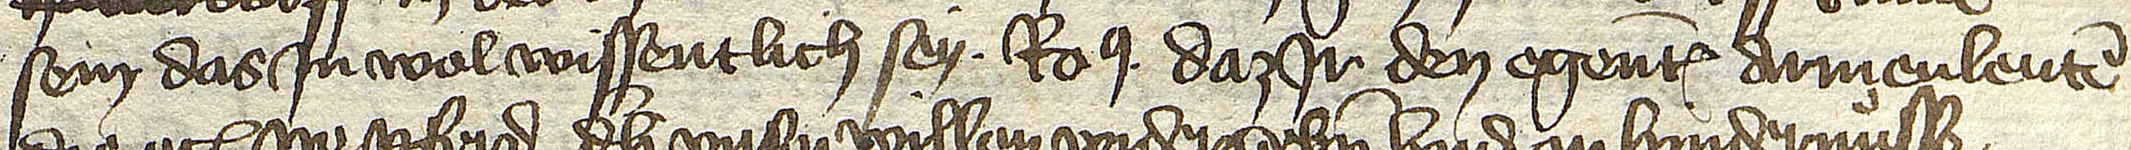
ſein das In wol wiſſentlich ſey . Ro* . daʒ Ir den egent* Armenleute*
